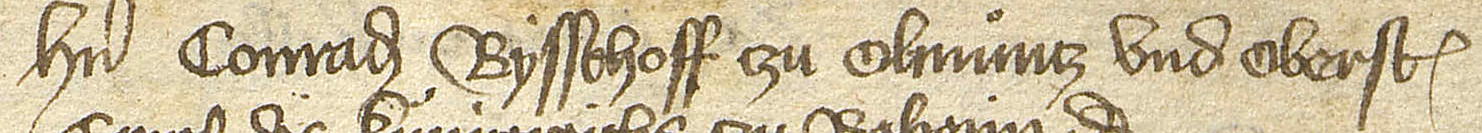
hn* Conrad Byſſchoff cʒu Olmüncʒ cnd Oberſt*
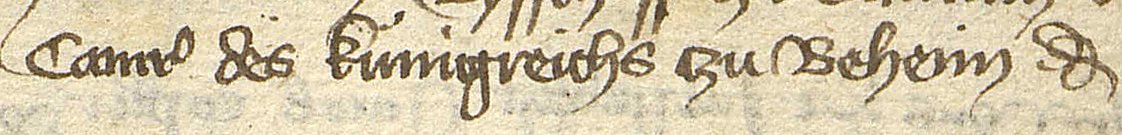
Camr* des künigreichs cʒu Beheim %
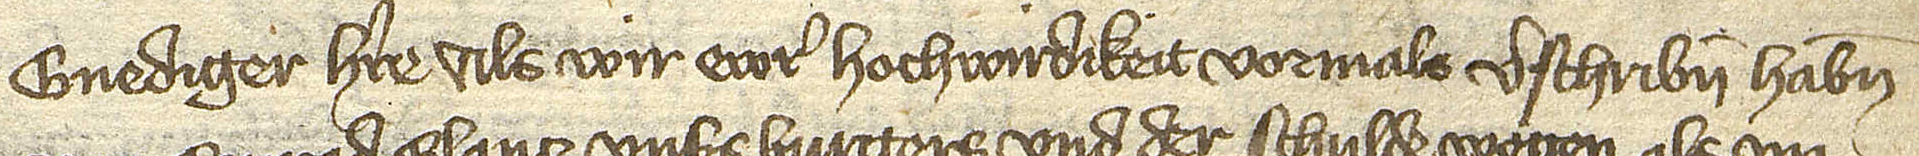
Gnediger h*re Als wir ewr* hochwirdikeit vormals v*ſchribn* habn*
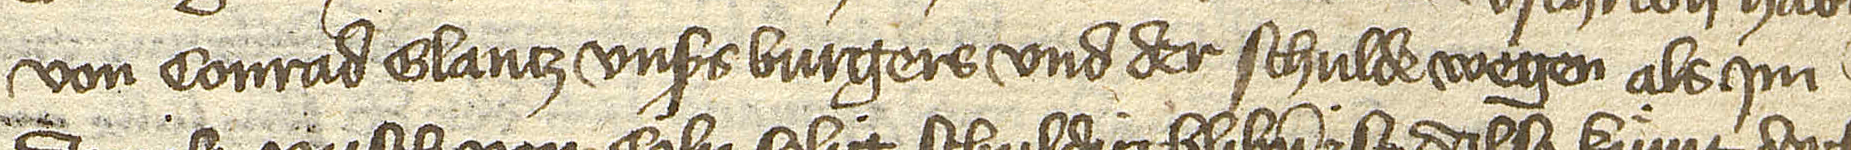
von Conrad Glancʒ vnſ*s burgers vnd der ſchulde wegen als Im
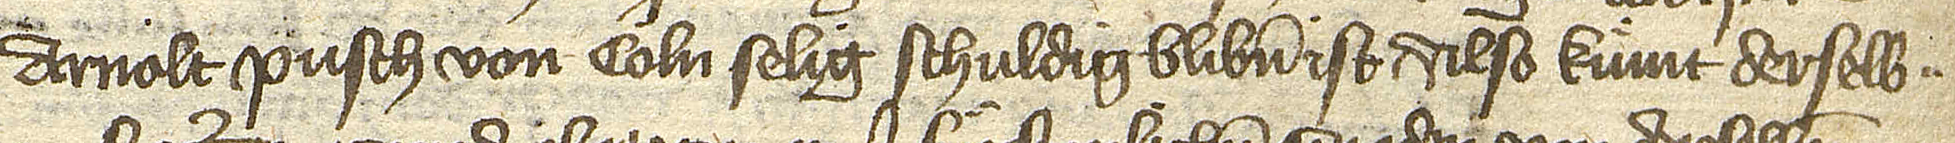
Arnolt Puſch von Cöln ſelig ſchuldig blibn* iſt / Alſo kümt derſelb ~
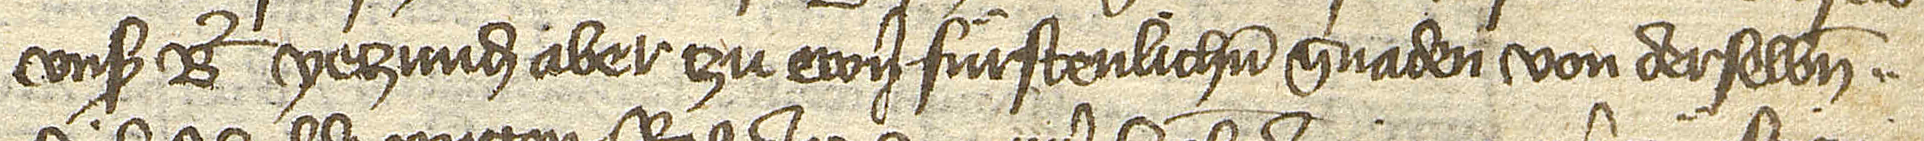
vnſ* B* yecʒund* aber cʒu ewn* fürſtenlichn* gnaden von derſelbn* ~
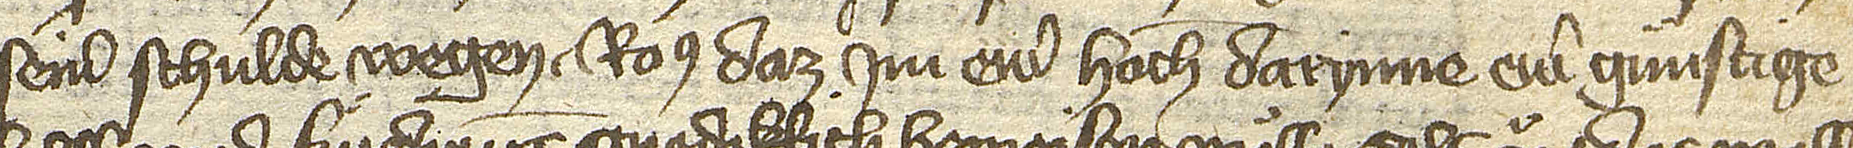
ſein* ſchulde wegen / Ro* daʒ Im ew* hoch* darynne ew* günſtige
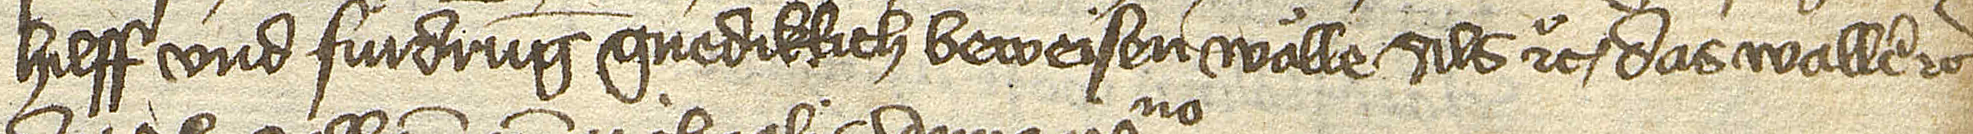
hilff vnd fürdrug* gnediklich beweiſen wölle / Als ec* / Das wolle* ec*
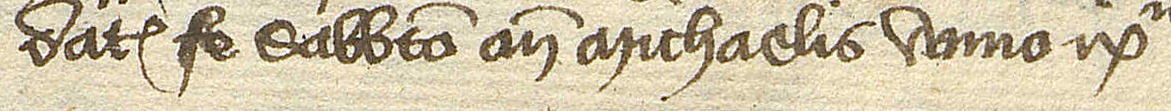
Dat* fe Sabbto* an* Michaelis Anno ix*
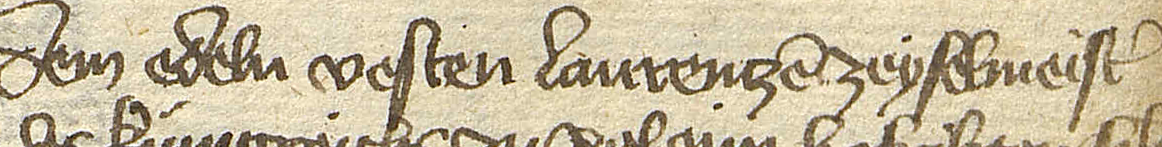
Dem edeln veſten Laurencʒe* ʒeyſelmeiſt*
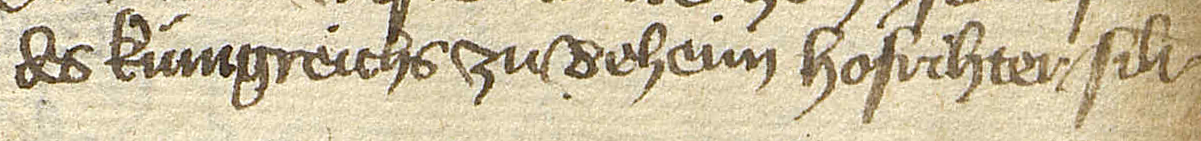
des künigreichs cʒu Beheim hofrichter / ſilr
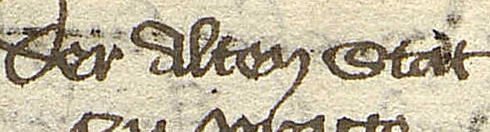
Der Alten Stat
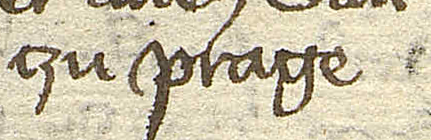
cʒu Prage
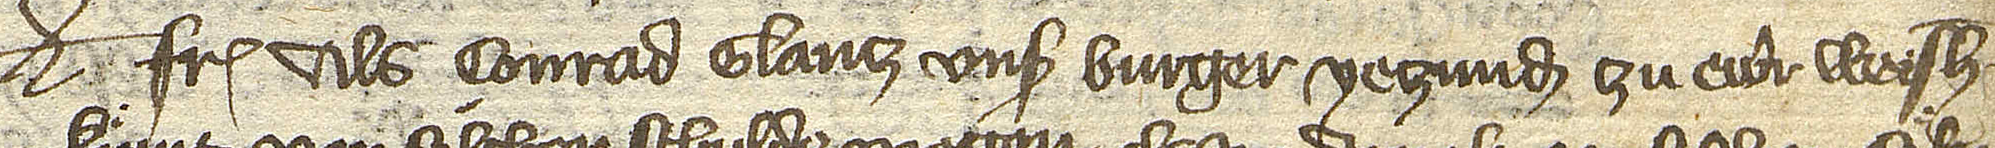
L* fr* Als Conrad Glancʒ vnſ* burger yecʒund* cʒu ew*r weiſh*
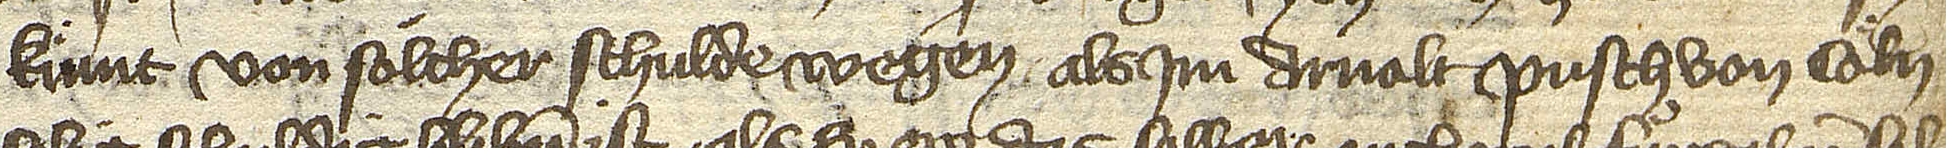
kümt von ſölcher ſchulde wegen / als Im Arnolt Puſch von Cöln
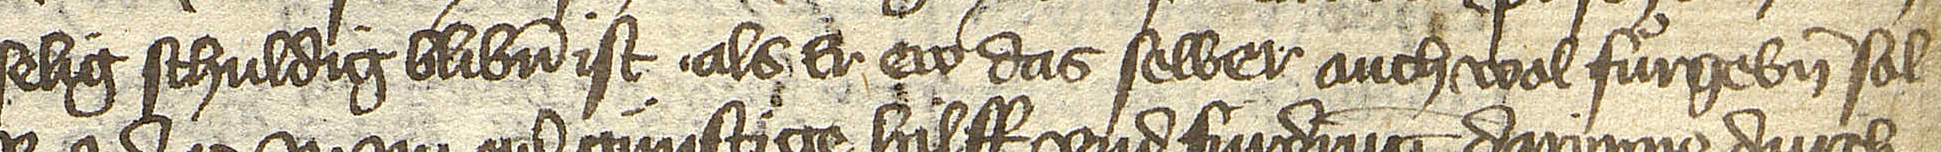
ſelig ſchuldig blibn* iſt . als Er ew das ſelber auch wol fürgebn* ſol
